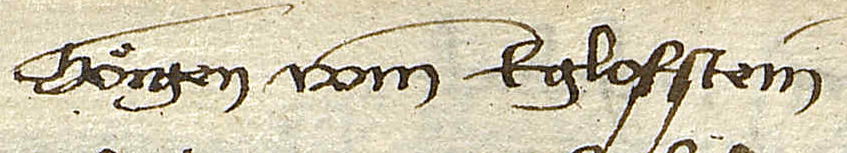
Görgen vom* Eglofſtein
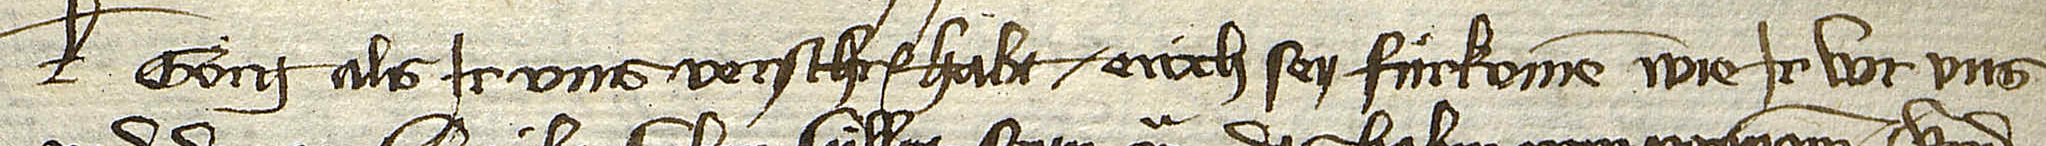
L* Görg als Ir vns verſchr* habt / ewch ſey fürkome* wie* Ir vor vns
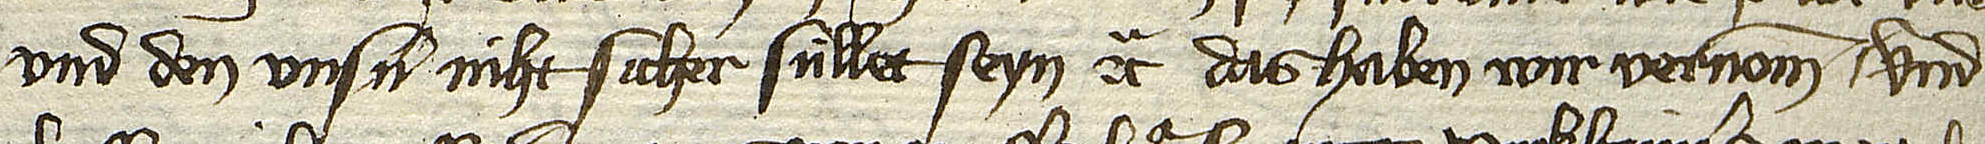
vnd den vnſ n* niht ſicher ſüllet ſeyn ec* das haben wir vernom* / Vnd
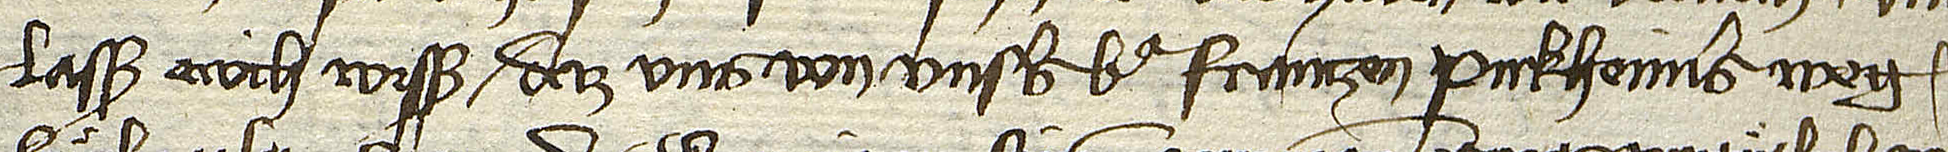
Laſſ* ewch wiſſ* diʒ vns von vnſ*s b* francʒen Pirkheims* weg*
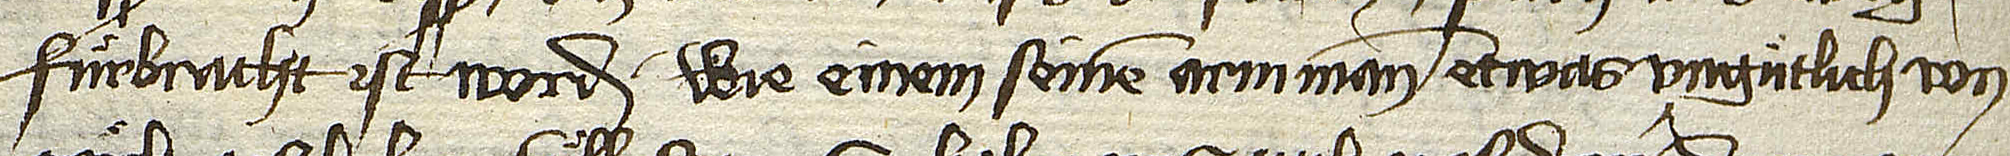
fürbracht iſt word* / Wie einem ſeine* arm man* etwas vngütlich von
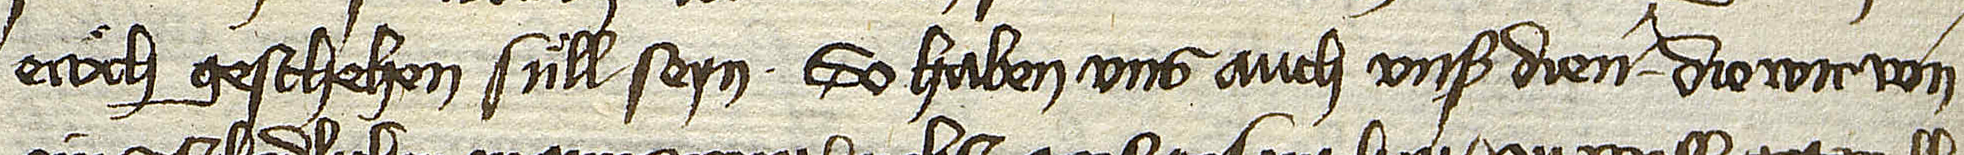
ewch geſchehen ſüll ſeyn . So haben vns auch vnſ* dien* - die wir von
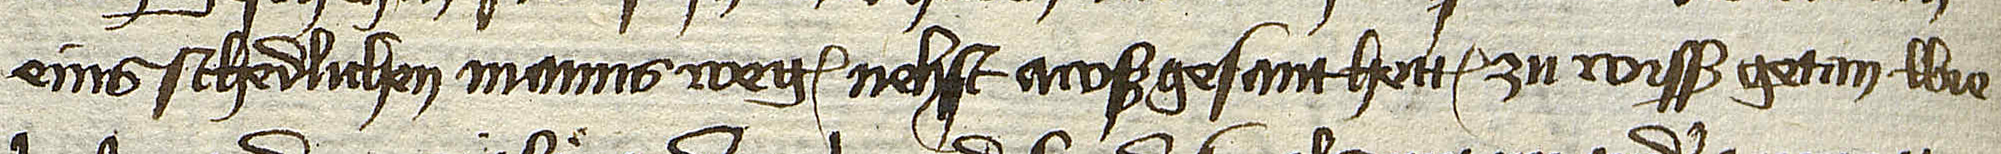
eins ſchedlichen manns weg nehſt awſʒgeſant hett* ʒu wiſſ* getan wie
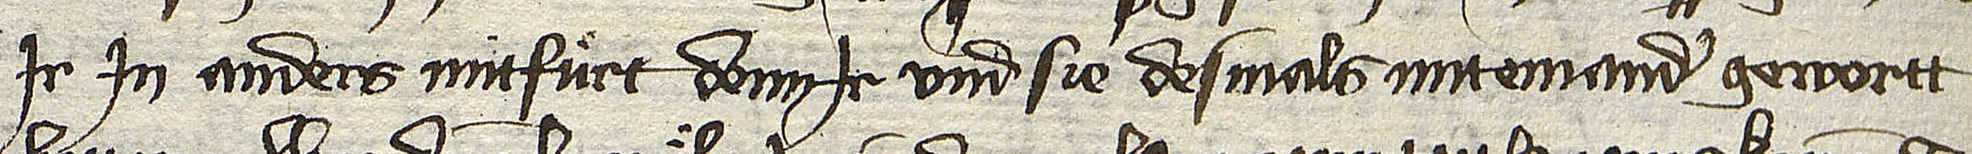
Ir In anders mitfürt denn Ir vnd ſie deſmals miteinand* gewortt
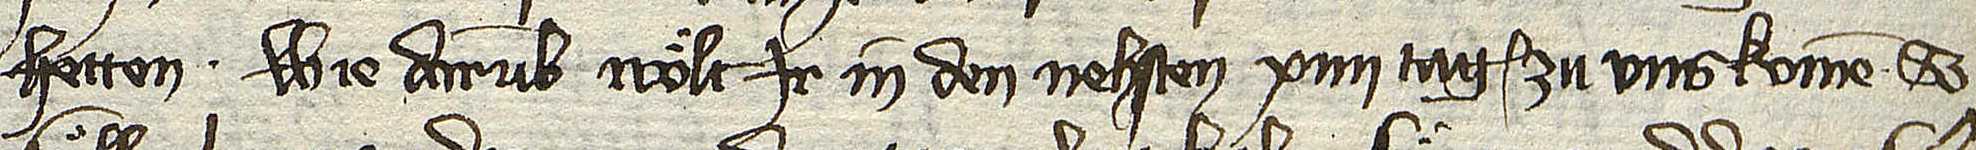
hetten. Wie darub* wölt Ir in den nehſten xiiii tag* ʒu vns kome* . So
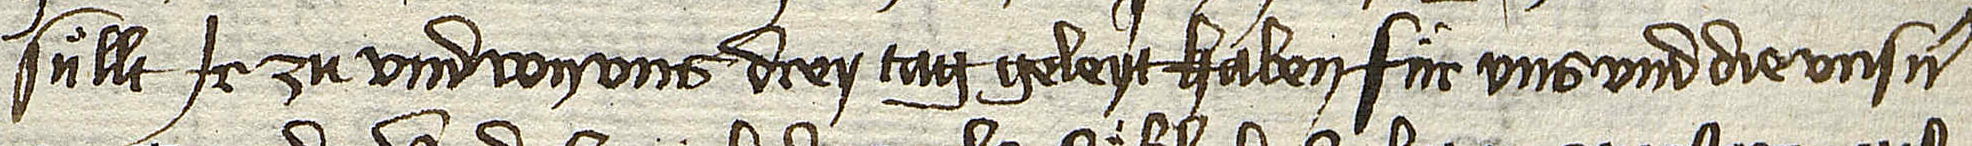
ſüllt Ir ʒu vnd von vns drey tag geleyt haben für vns vnd die vnſn*
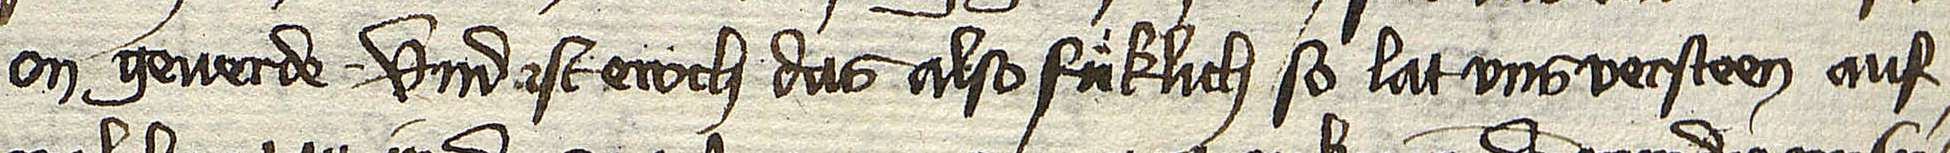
on geuerde . Vnd iſt ewch das alſo füklich ſo lat vns verſteen auf
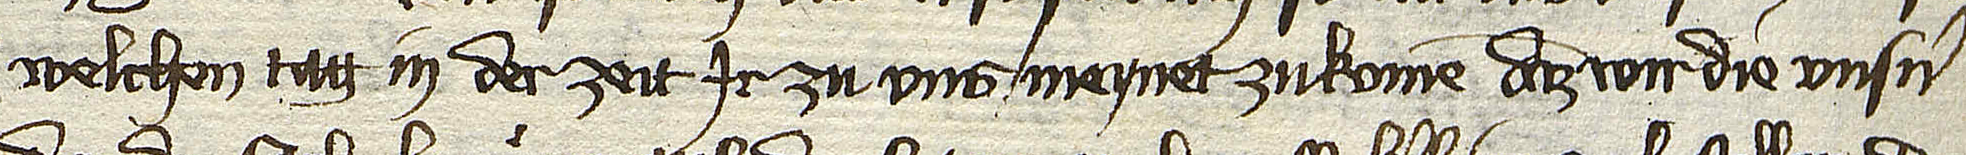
welchen tag in der ʒeit Ir ʒu vns meynet ʒu kome* daʒ wir die vnſ*n
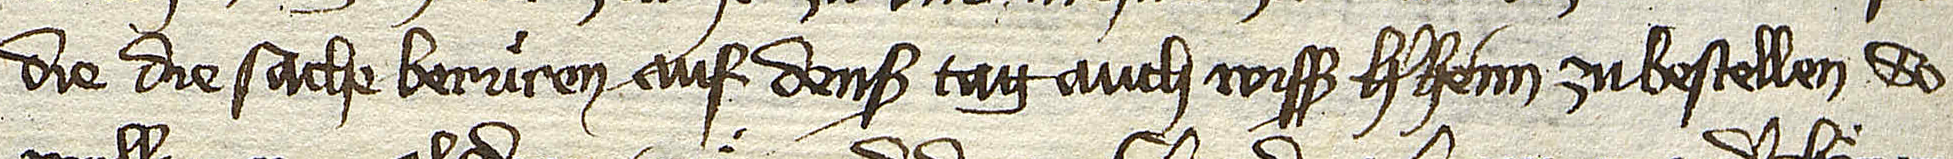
die die ſache berüren auf denſ* tag auch wiſſ* H* heim ʒubeſtellen So
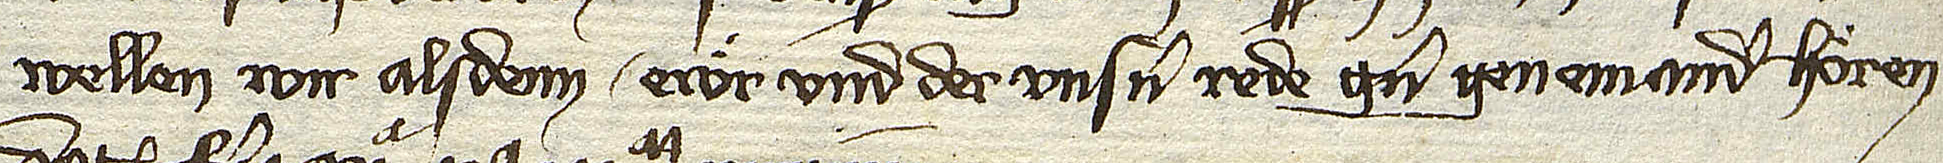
wellen wir alſdenn / ewr vnd der vnſn* rede gn* gen einand* hören
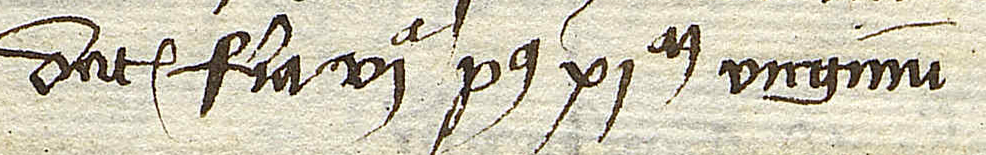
Dat* f*ia vi* p* xi* virginu*
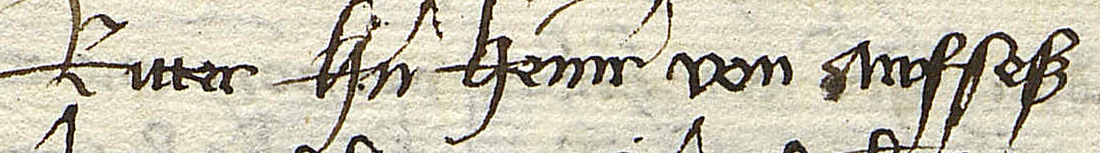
Ritter H*n Heinr* von Awfſeʒ
